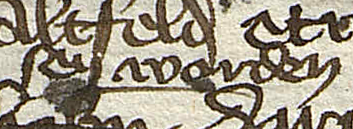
ſey worden
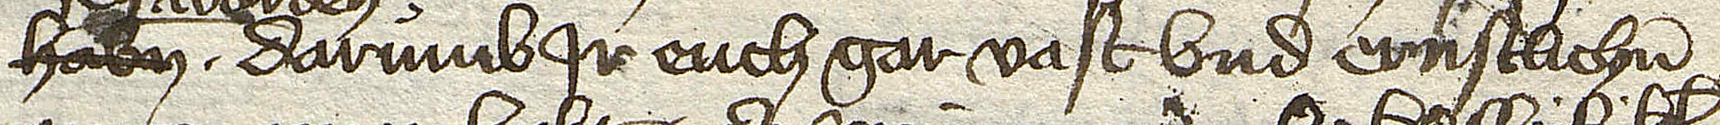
habn* / Darümb Ir euch gar vaſt vnd ernſtlichn*
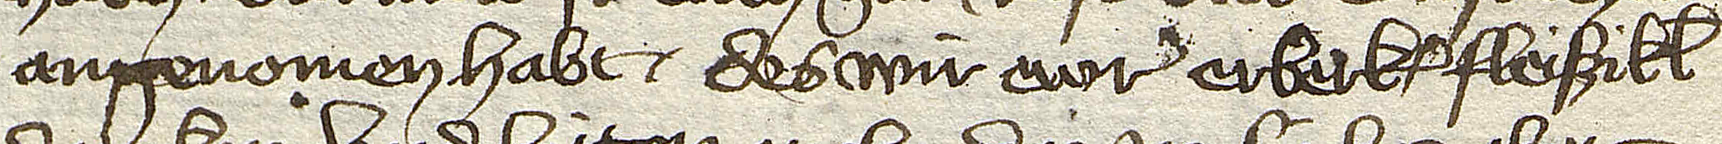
angenomen habt / Des wir ewr* erberk* fleiſʒikl*
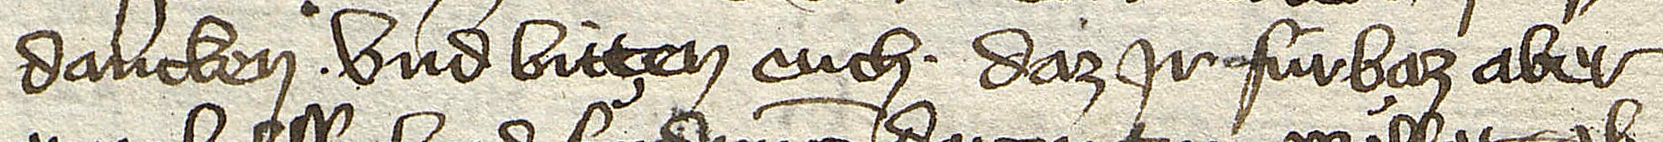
dancken . Vnd bitten euch . daʒ Ir fürbaʒ aber
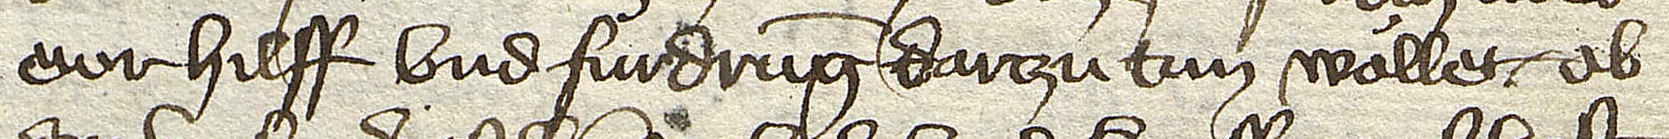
ewr hilff vnd fürdru*g darcʒu tun wöllet / ob
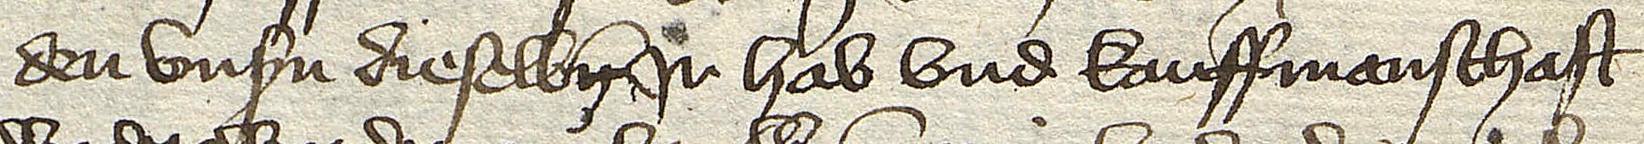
den vnſ*n dieſelbn* Ir hab vnd kauffmanſchaft
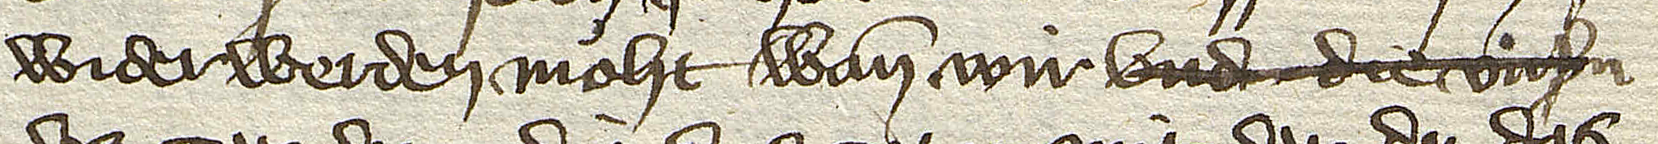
wider werden möht / wan* wir vnd die vnſ*n
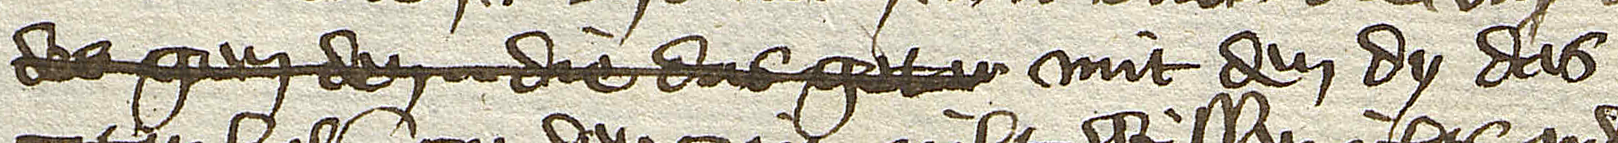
des gen den ~ die das getan mit den dy das
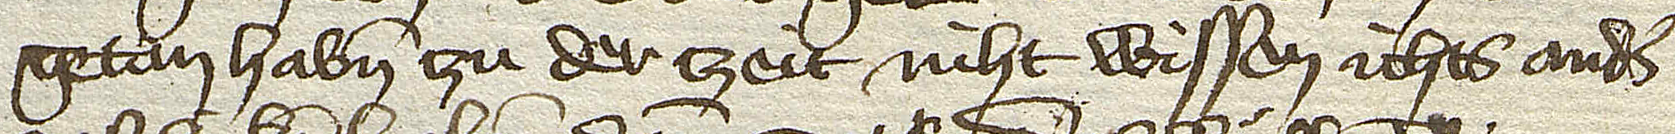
getan habn* cʒu der cʒeit niht wiſſen ichts and*s
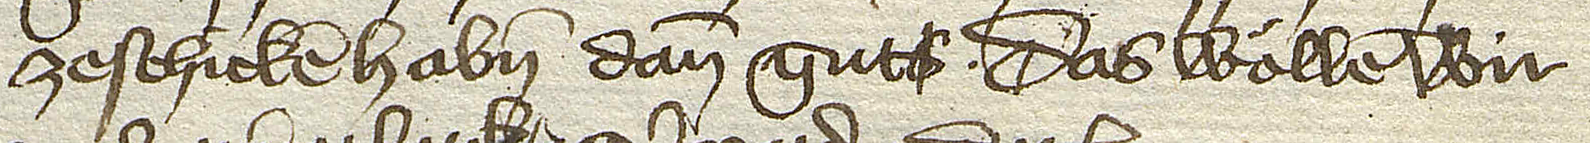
cʒeſchike* habn* dan* guts . Das wölle* wir
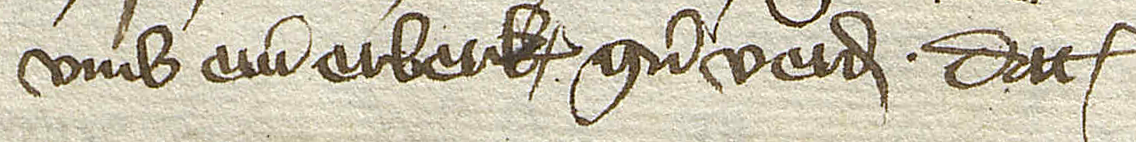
vmb ew* erberk* gn* verd* . Dat*
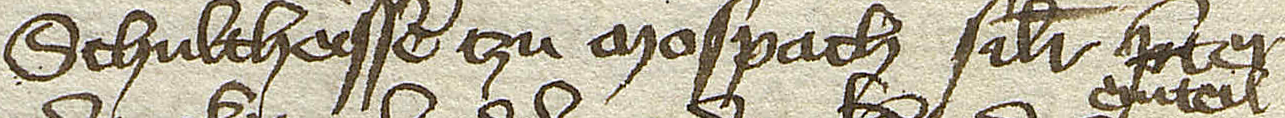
Schultheiſſe* cʒu Moſpach ſilr* p*ter
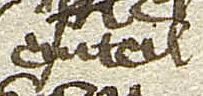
einteil
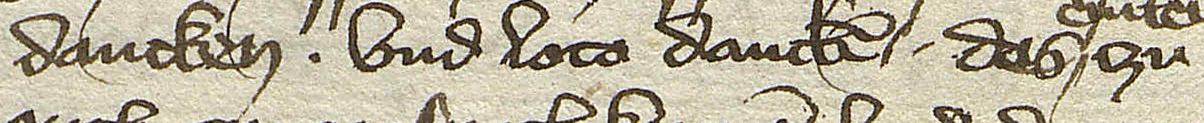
dancken . vnd loco dancke* / das cʒu
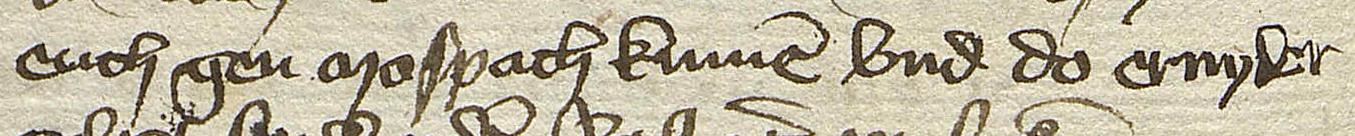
euch gen Moſpach kume* vnd do ernyder
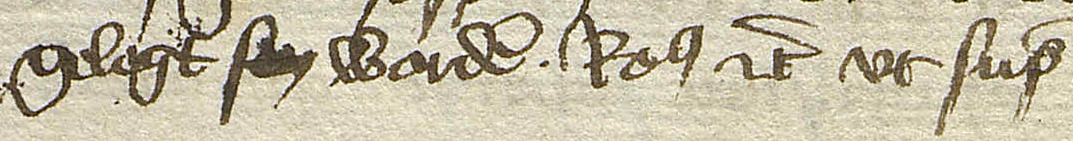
gelegt ſey worde* . Ro* ec* vt ſup*
